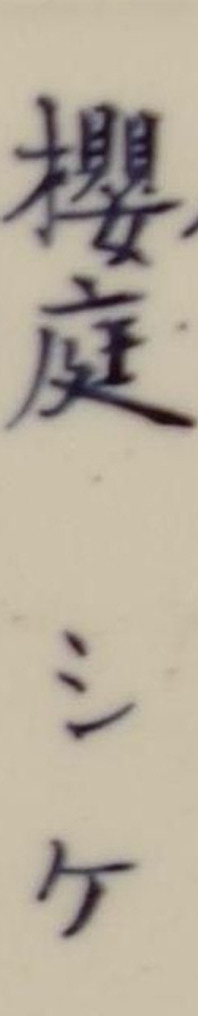桜庭シケ
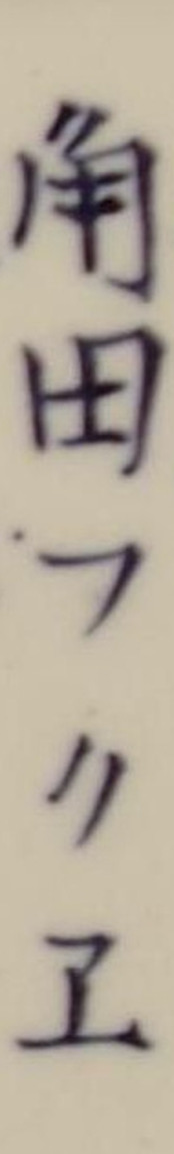角田フクヱ
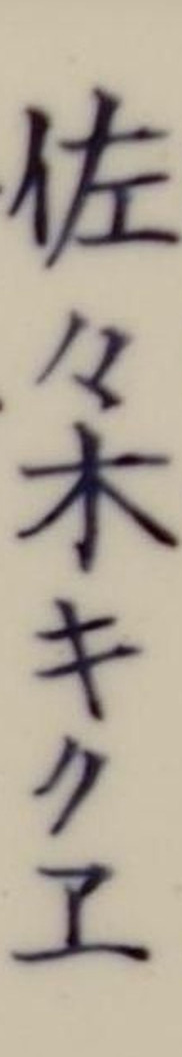佐々木キクヱ
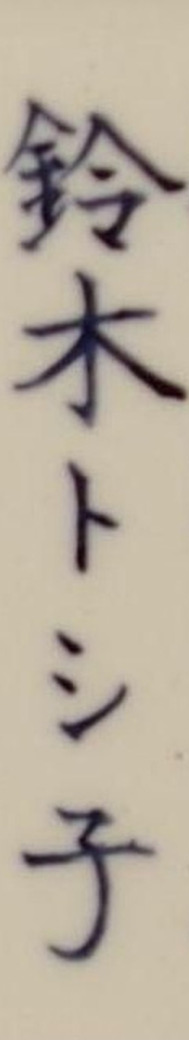鈴木トシ子
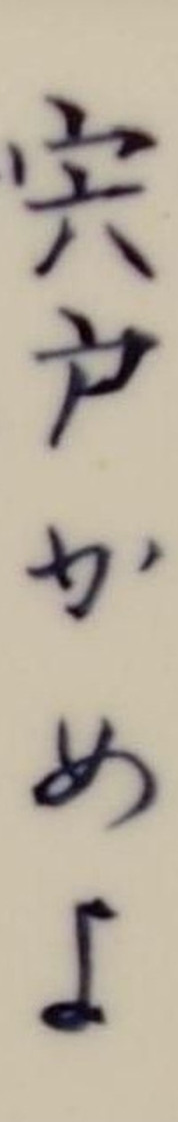宍戸かめよ
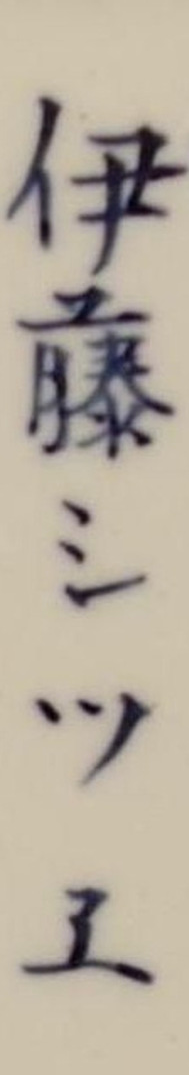伊藤シツヱ
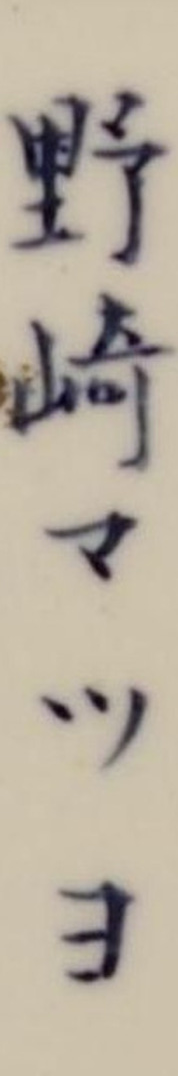野崎マツヨ
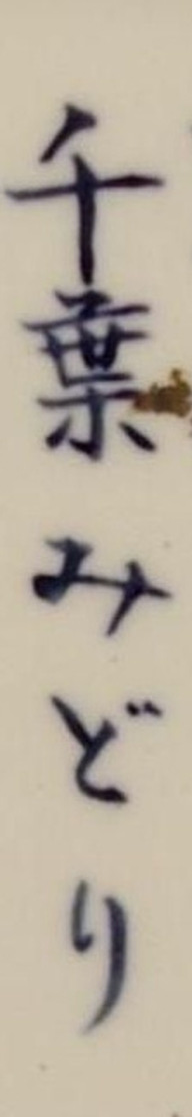千葉みどり
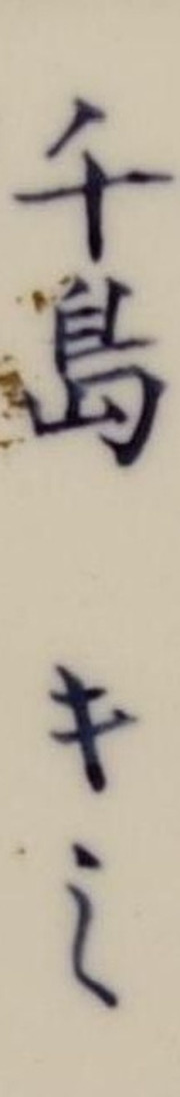千島キミ
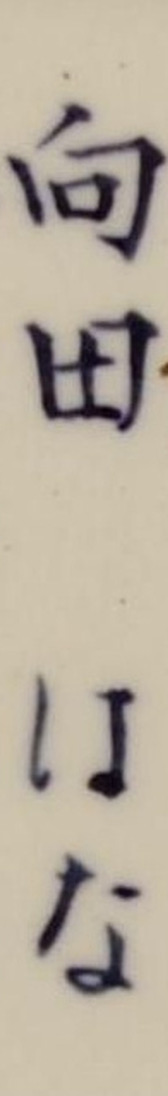向田はな
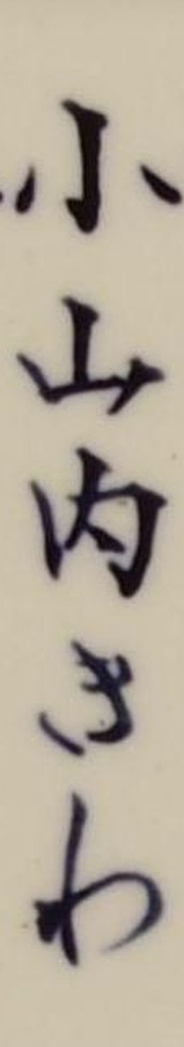小山内さわ
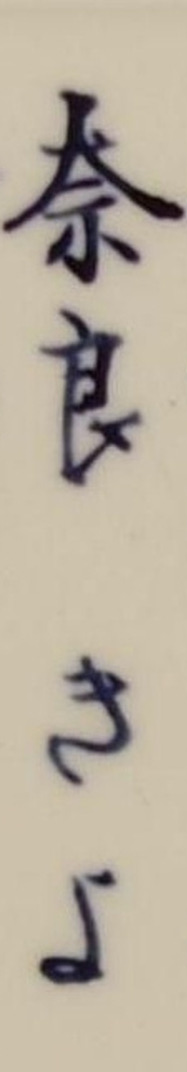奈良きよ
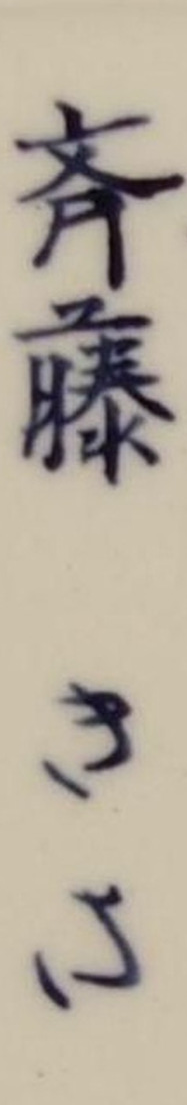斉藤きさ
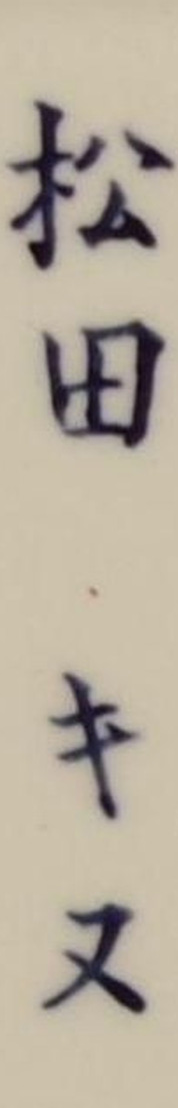松田キヌ
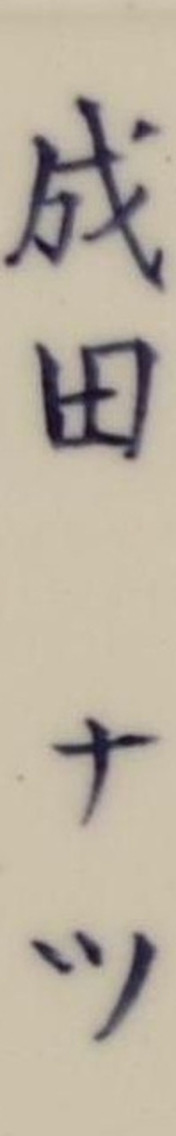成田ナツ
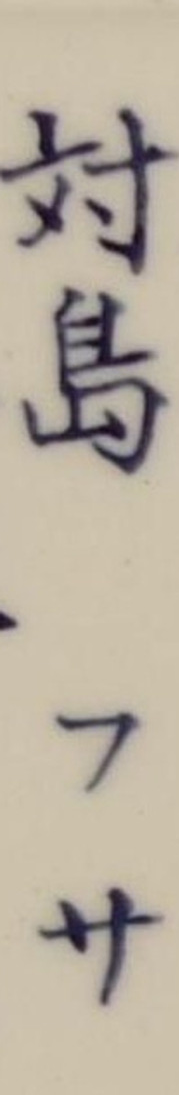対島フサ
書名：M~S
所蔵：高野山金剛峯寺
